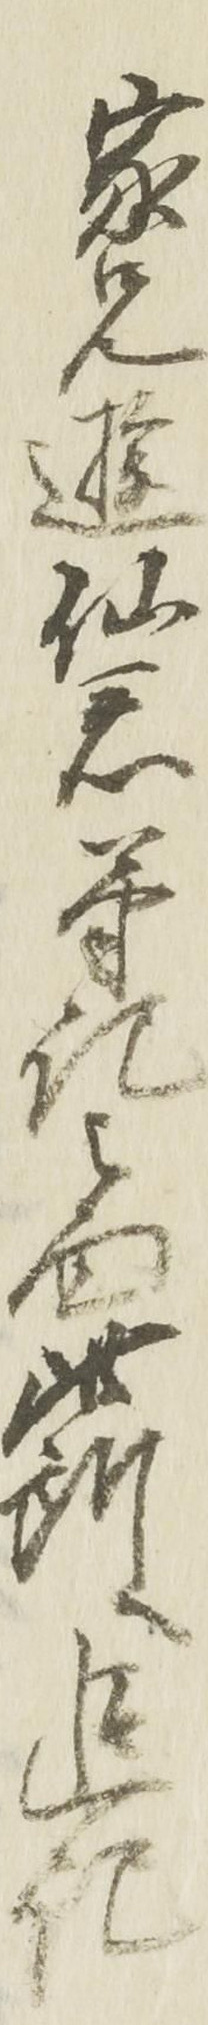家兄遊仙君筆記之面此所へ追記
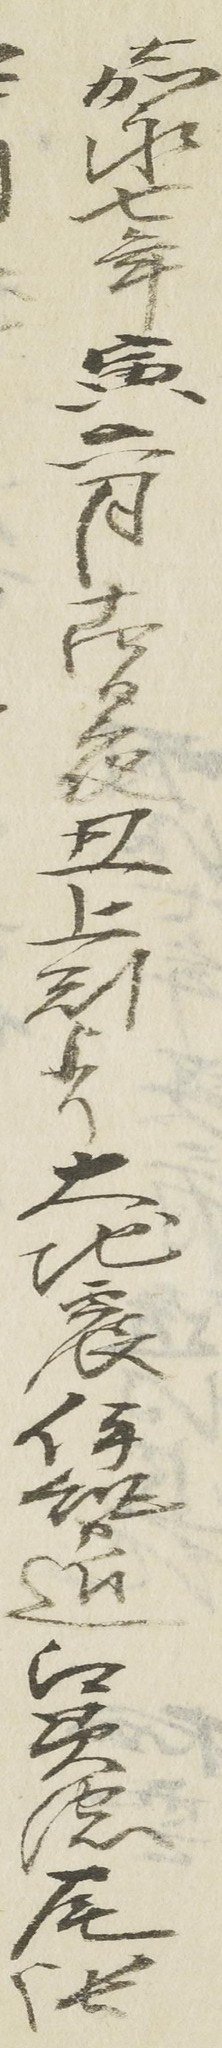嘉永七年寅六月十四日夜丑上刻より大地震伊勢近江美濃尾張
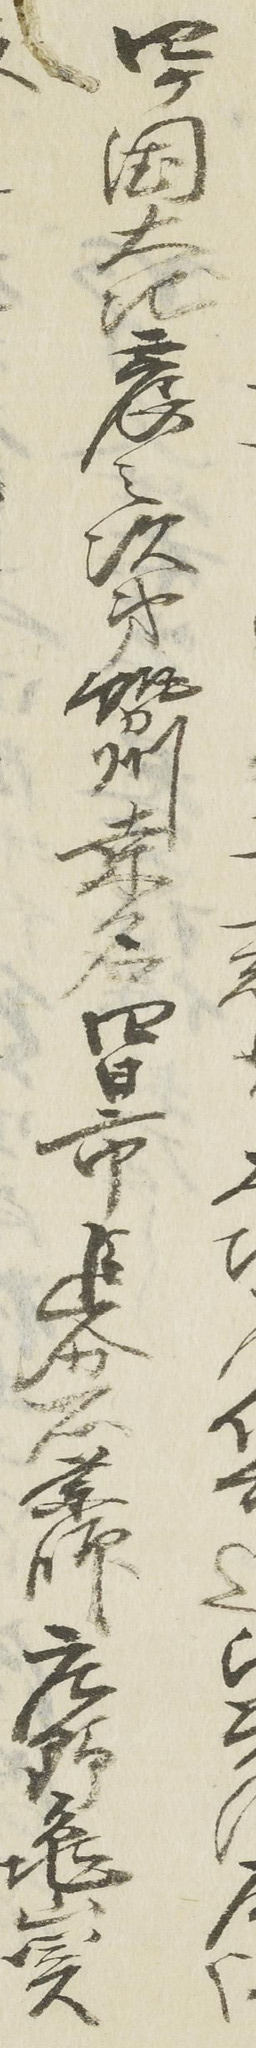四ケ国大地震之次第勢州桑名四日市追分石薬師庄野亀山関
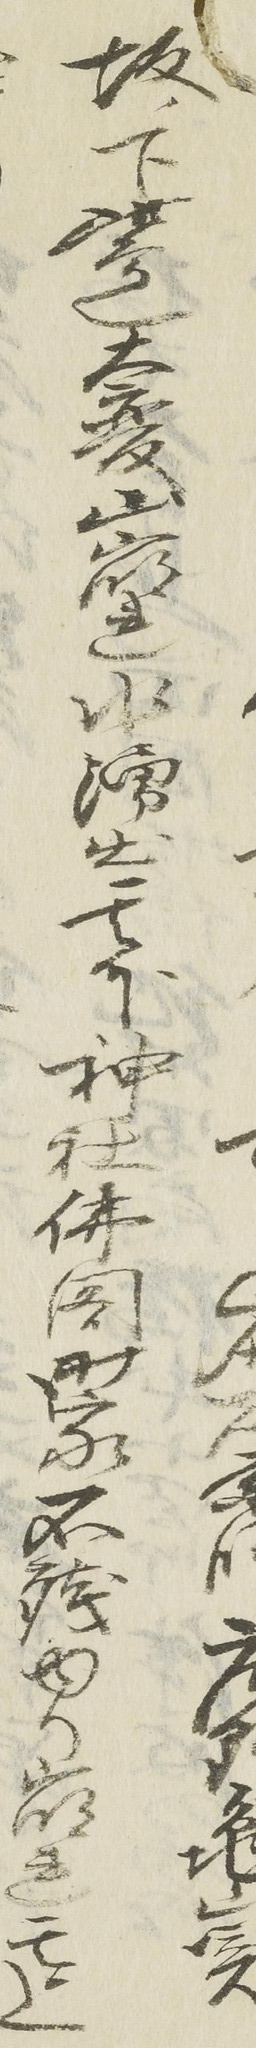坂下此辺大変山崩れ水湧出其外神社仏閣町家不残ゆり崩れ其上
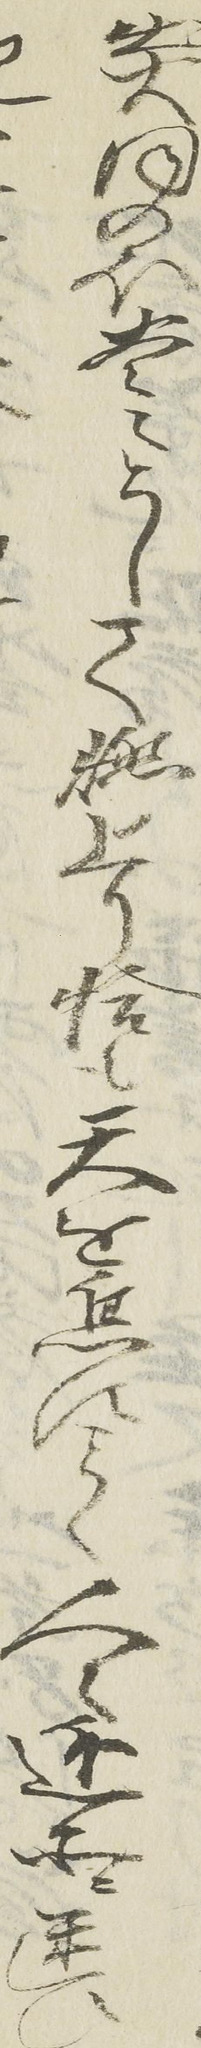出火ほのほ炎〻として燃上り恰も天を焦すことく人〻逃所に迷ひ
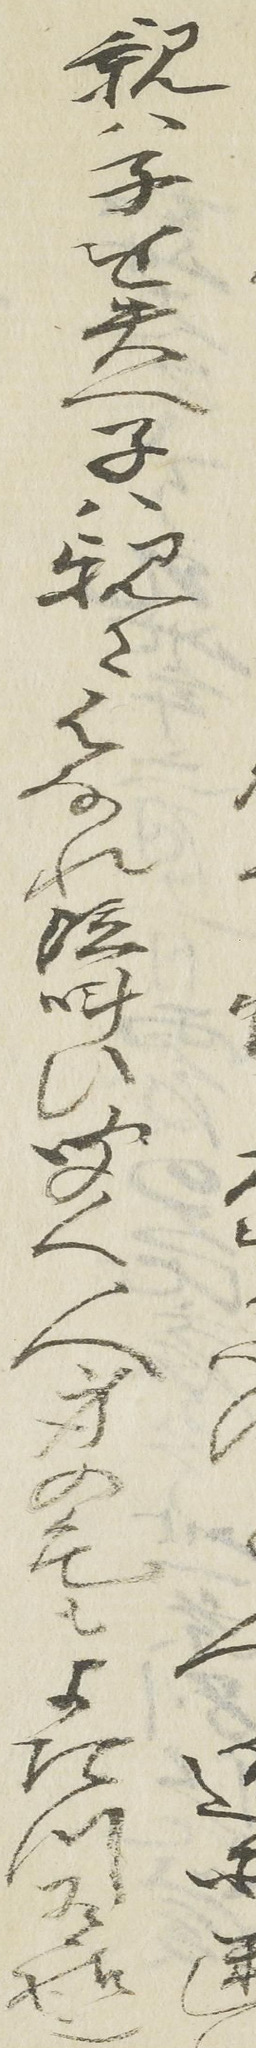親は子を失へ子は親とはなれ泣叫ひ聞く人身の毛もよたつ有様也
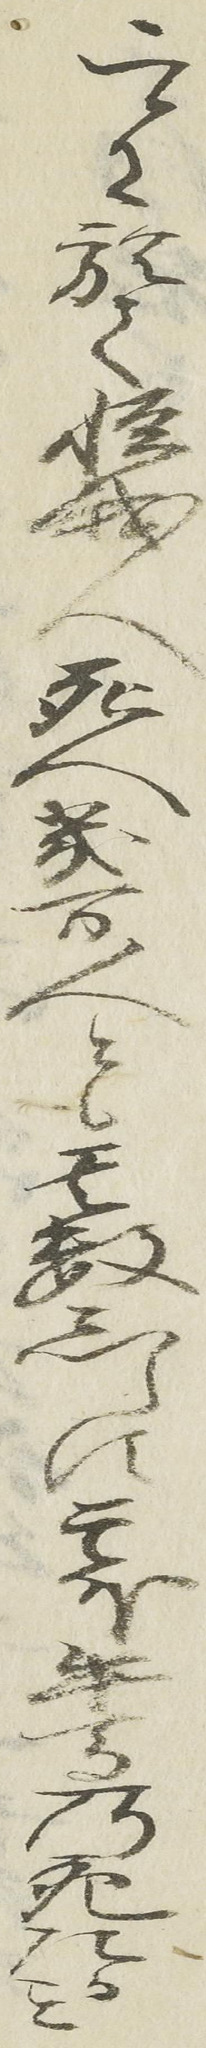ここに於て怪我人死人幾万人とも其数しれす其外牛馬の死たること
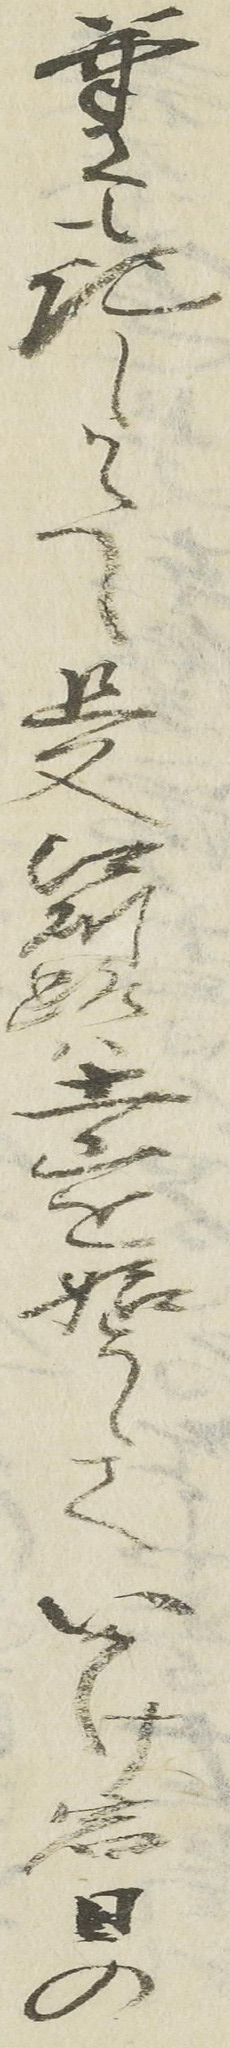筆にも記しかたし且又江州路は土山を始としていかけ宿日の
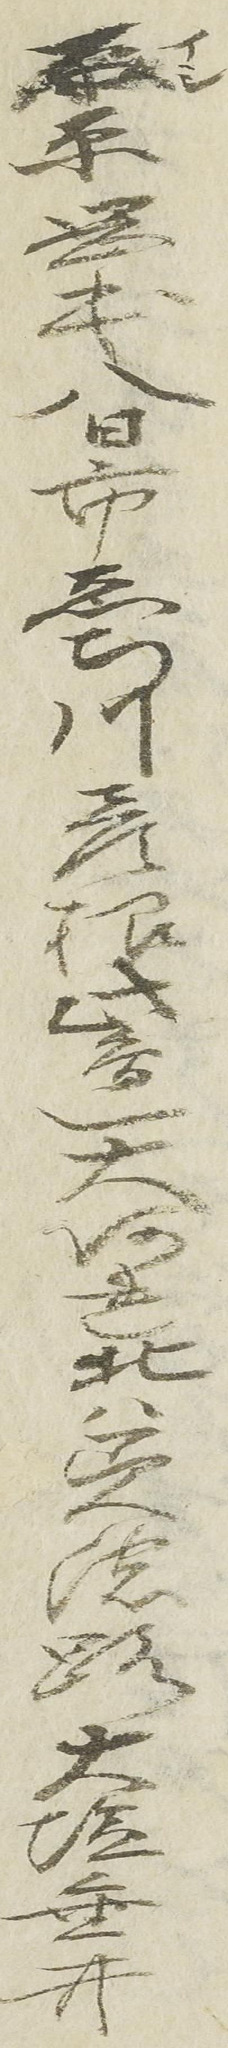石原岡本八日市愛ち川彦根此辺大あれ北は美濃路大垣垂井

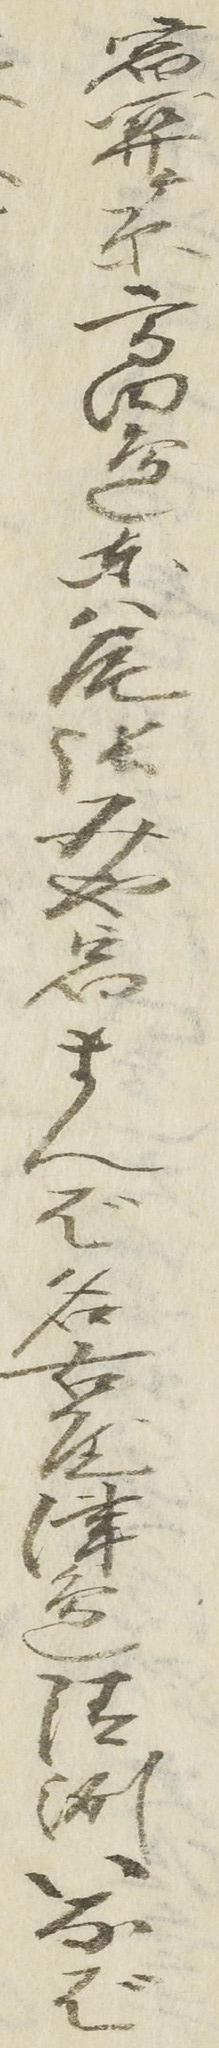宿関ヶ原高田辺東は尾張みや宿まんば名古屋津辺清洲いなば
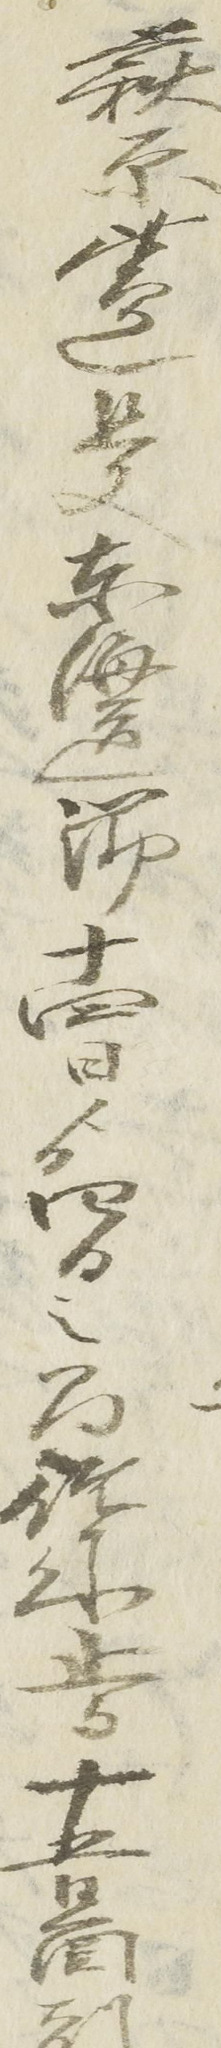萩原此辺且又東海道筋十四日ゟ四日之間往来止る十五日酉刻
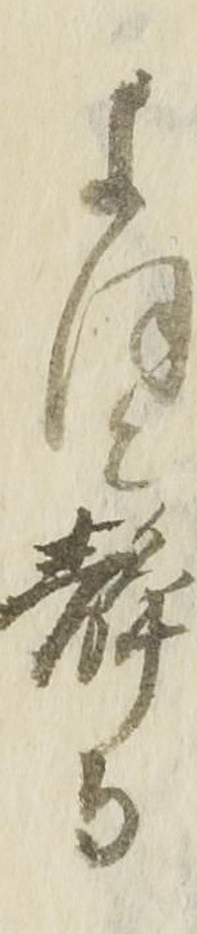にほゝ静る
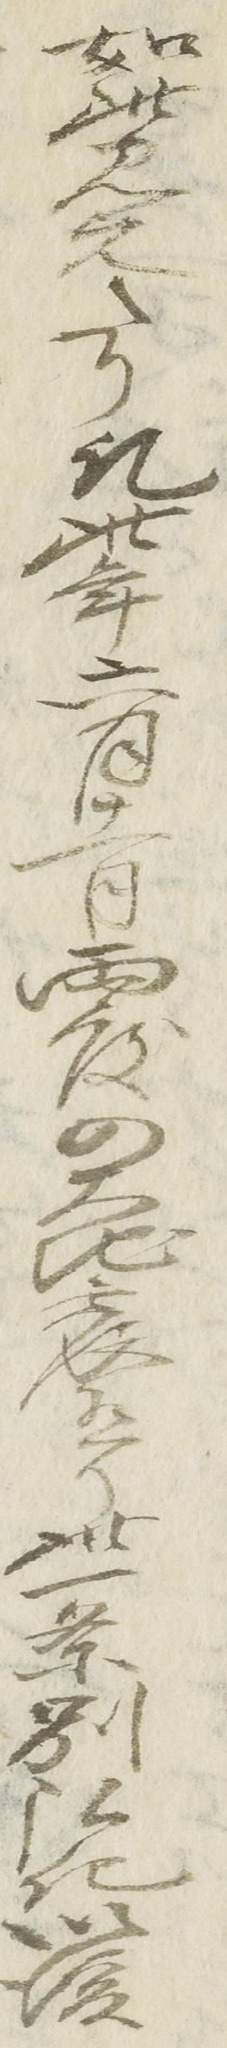如此見えたり凡此年六月十一月両度の大地震有り此一条別弘化以後
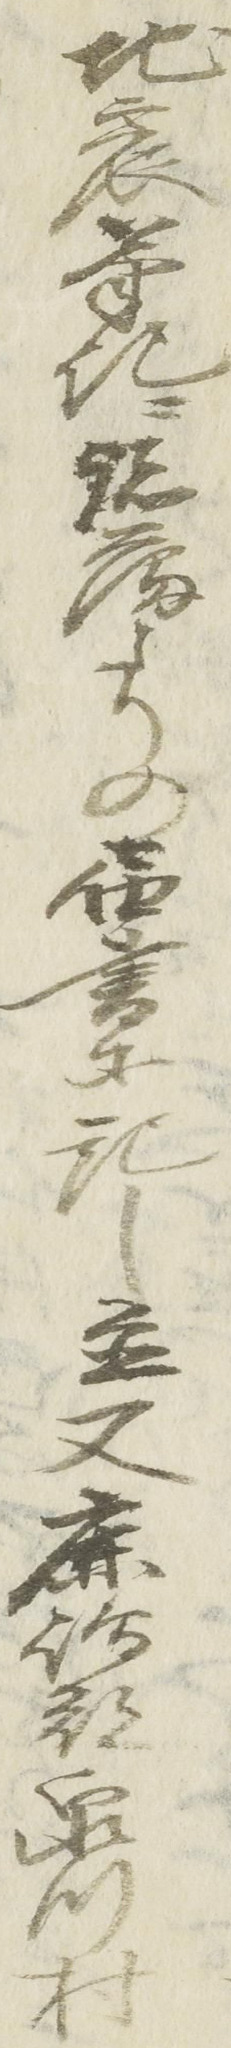地震筆記に諸藩よりの届書等記し置又鹿島郡泉川村
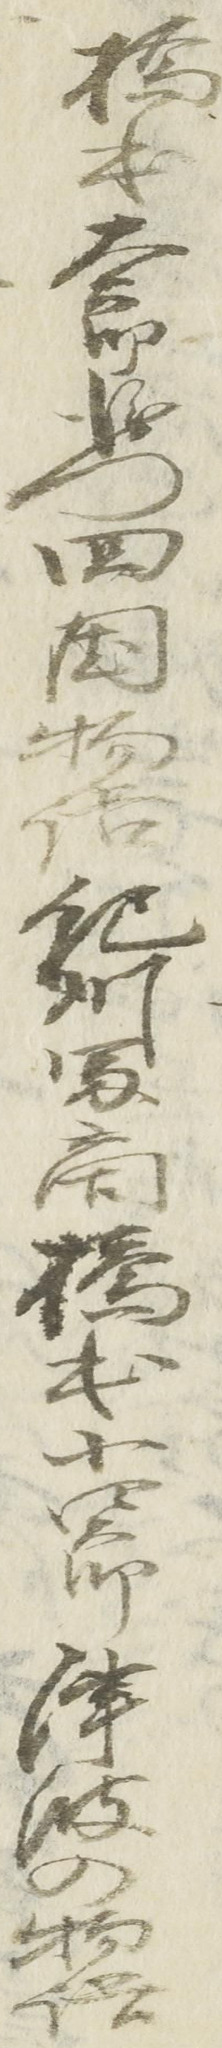橋本太郎衛門回国物語紀州富商橋本小四郎津波の物語
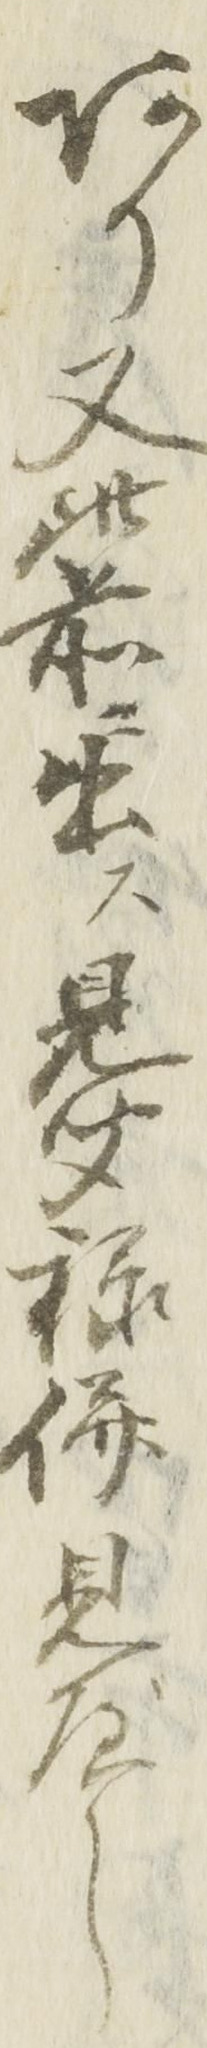あり又此前に出す見聞録併見べし
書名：安政乙卯江戸大地震筆記　安政丙辰八月大阪大雷雨之記追加　安政三辰年七月松前辺大地震并八月大風雨記録
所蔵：東京大学地震研究所図書室 Earthquake Research Institute Library, The University of Tokyo, JAPAN
